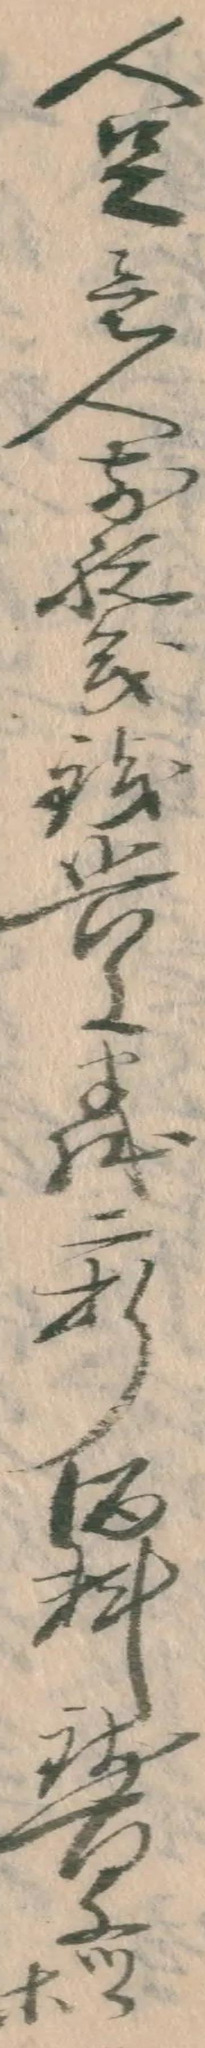人足壱人前祝義銭弐百文半紙二疋酒料銀百文ツ等
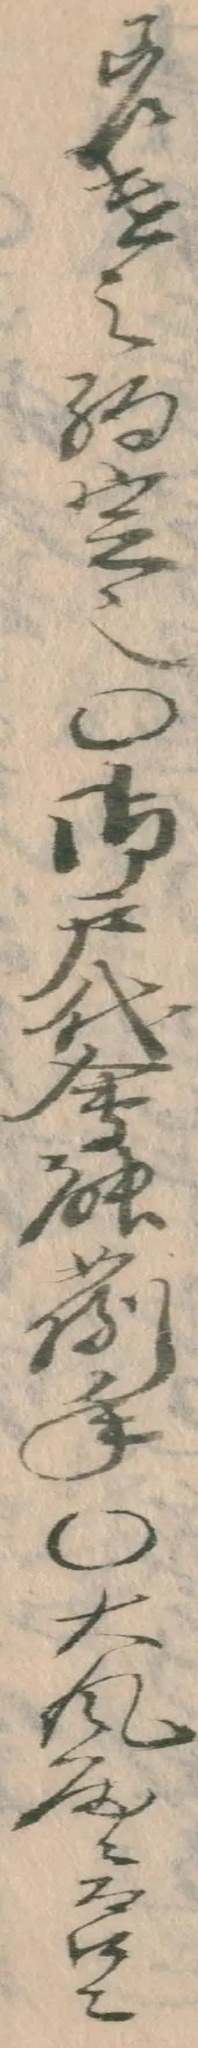差遣之約定也○御戸代會能如例年○大風雨ニ而口ニ
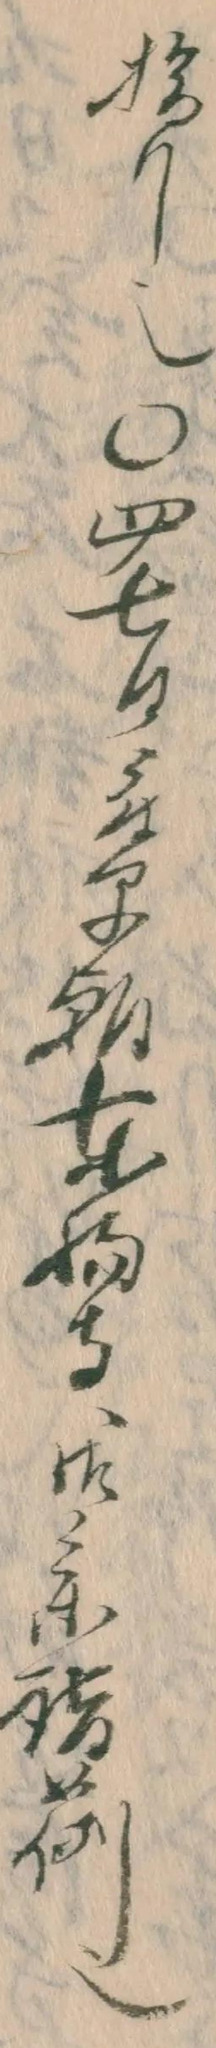橋引也○四七日ニ付早朝東物寺へ御参詣御例也
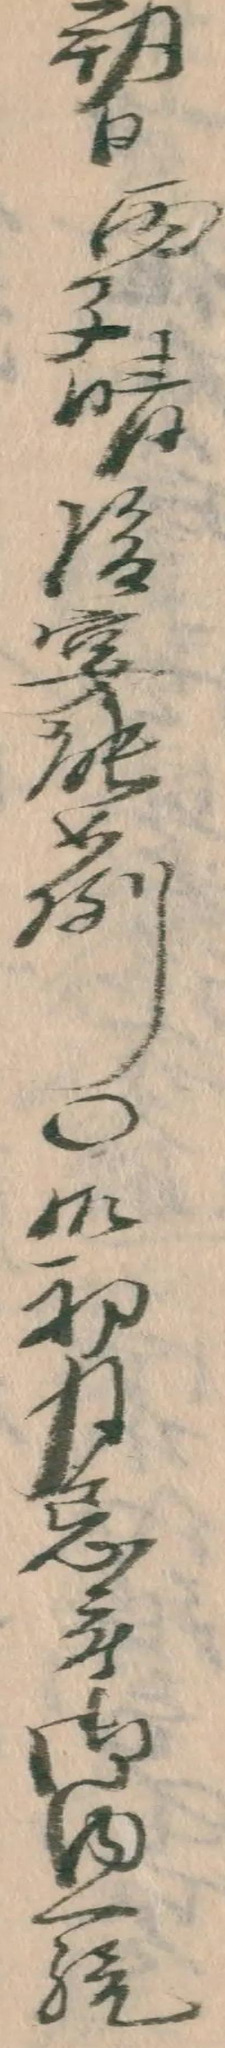朔日丙子晴後宴能如例〇御初月忌ニ付御内一統
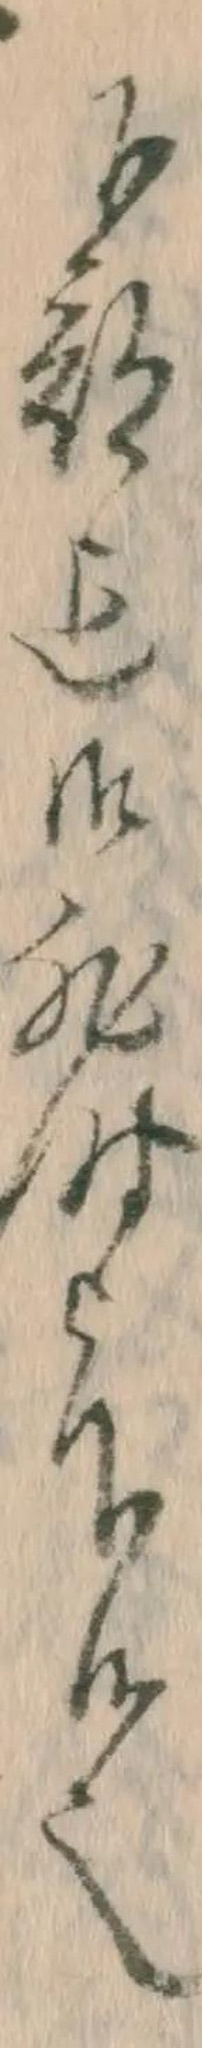下部迄御水時被下候也
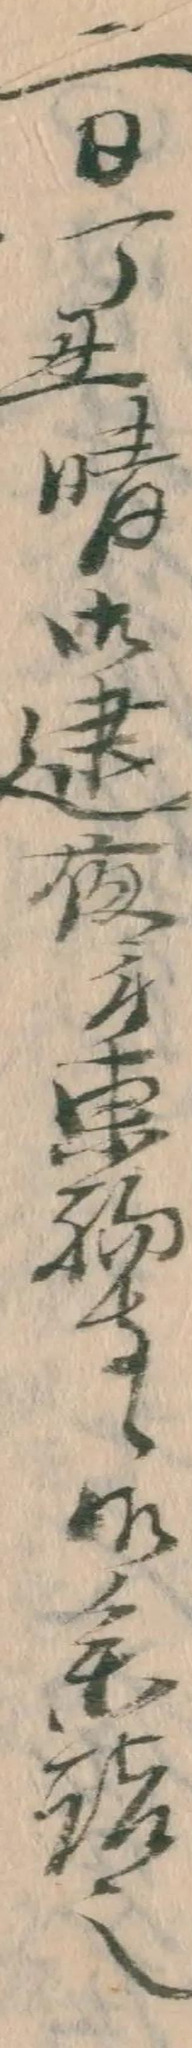二日丁丑晴御逮夜ニ付東福寺へ御参詣也
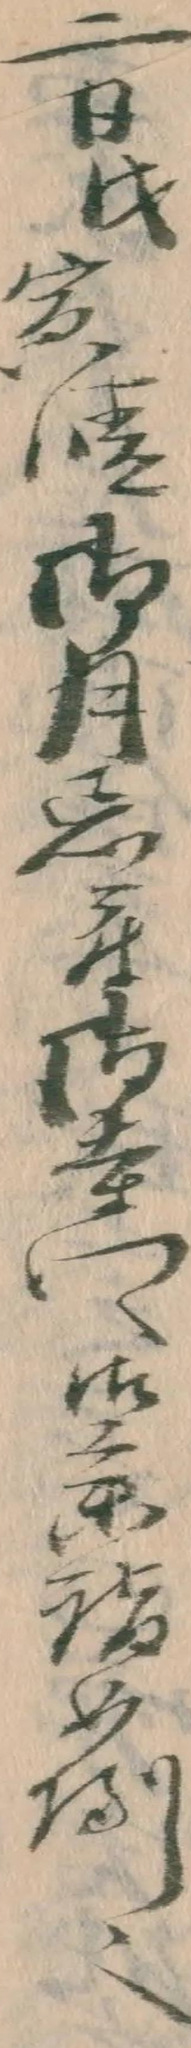三日戊寅晴御月忌ニ付御寺門へ御参詣如例也
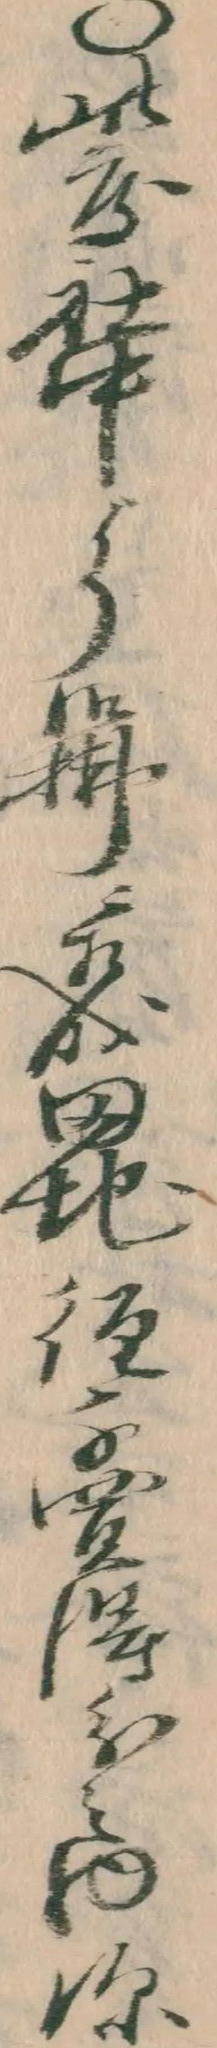○此度社中より御掛ニ相成田地経千買得分之内深
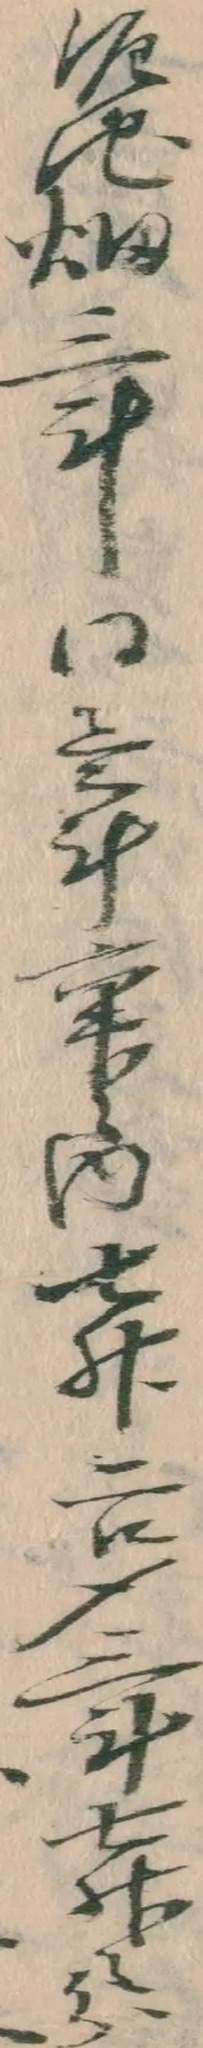泥地畑三斗同壱斗六升之内七升二合〆三斗七升之分
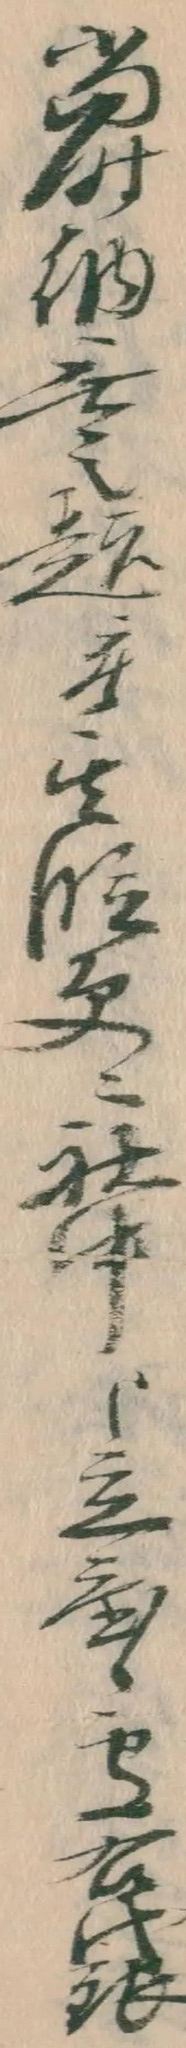當時納無之趣ニ付其段更に社申立置候處右代銀
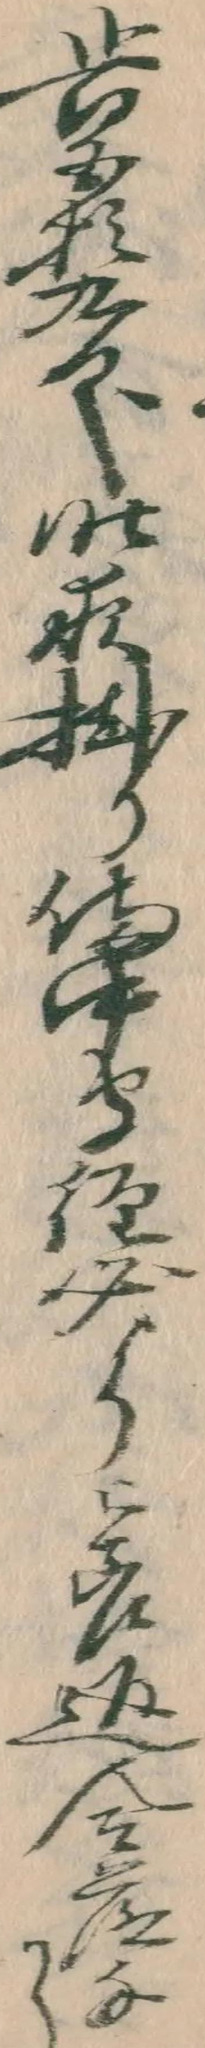弐百五拾九匁昨夜掛り備中守経必より被差返令落分了
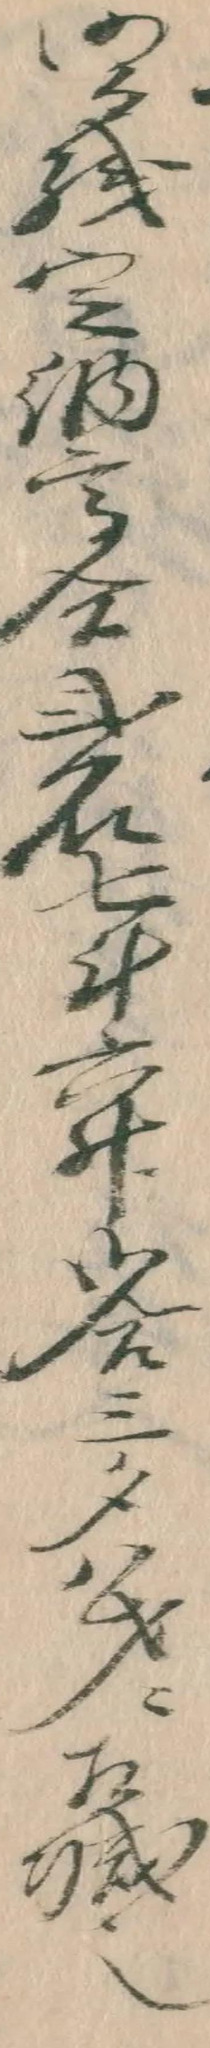仍而残定納高合弐石七斗六升弐合三勺八才に相減之
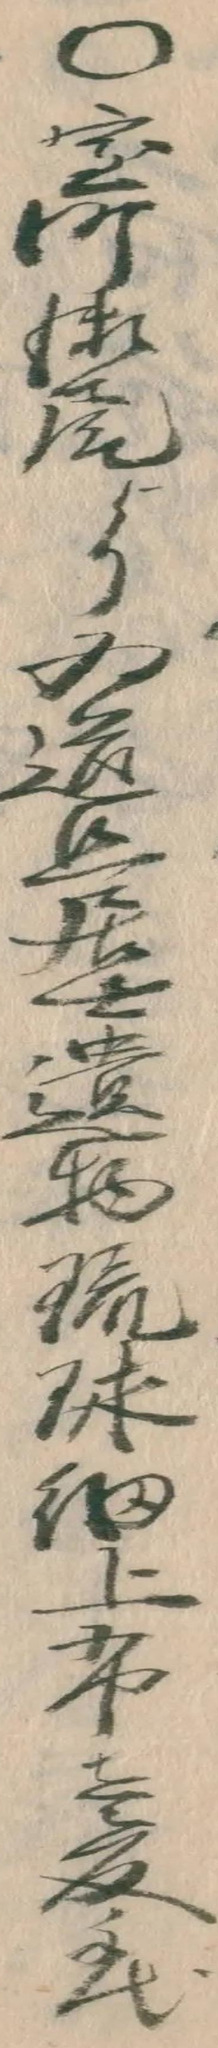○室町瀬尾より為道且居士遺物琉球細上布壱反手代
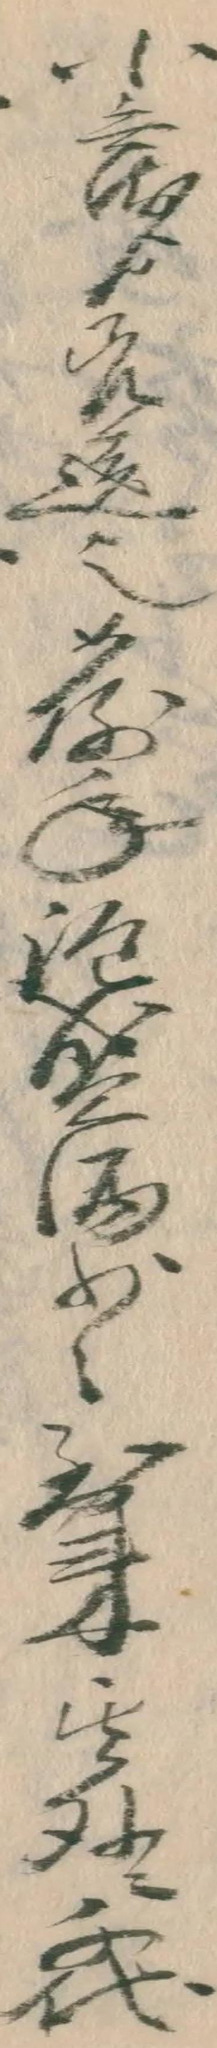小兵衛ゟ差送之如例年泡盛酒少し到来其外ニ手代
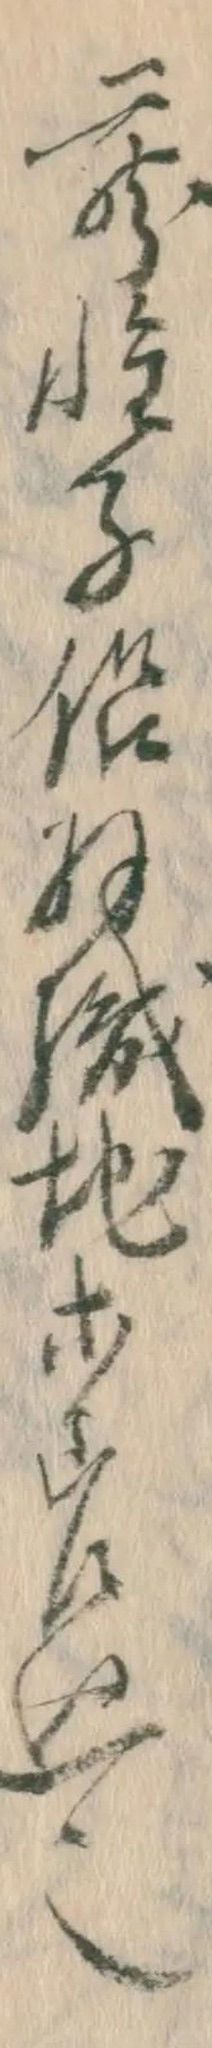蔵帷子役羽織地等差廻也
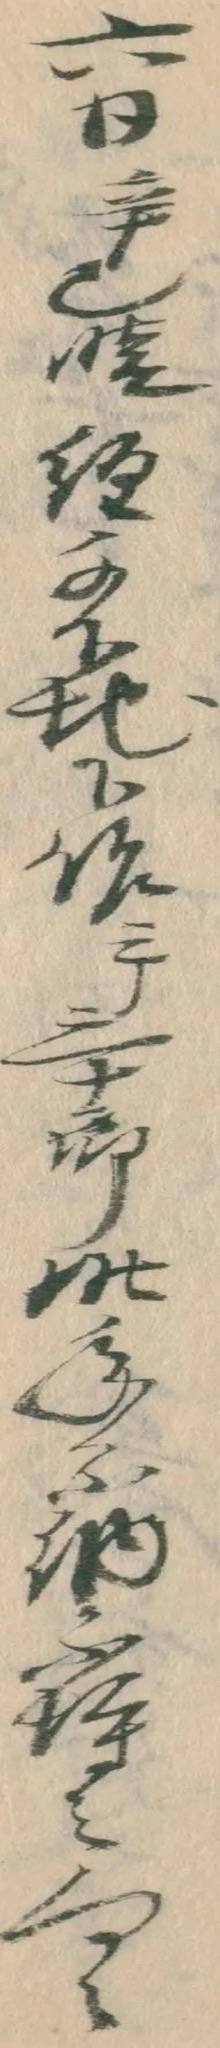六日辛巳晴経千下地下作三ノ三十郎昨年不納不埒之向之
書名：賀茂社記録. 第67冊
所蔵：国立国会図書館 National Diet Library, JAPAN
